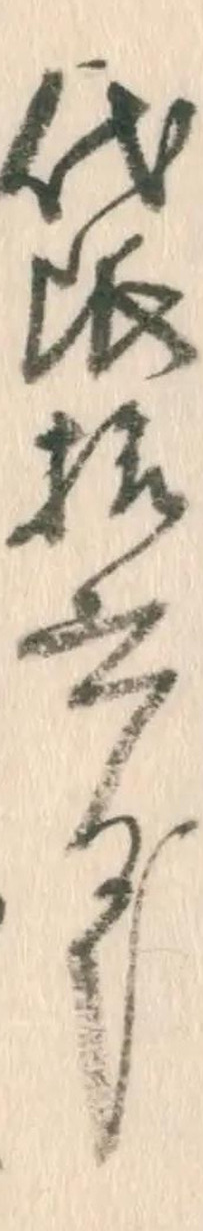代銀拾六匁但百本銀拾匁
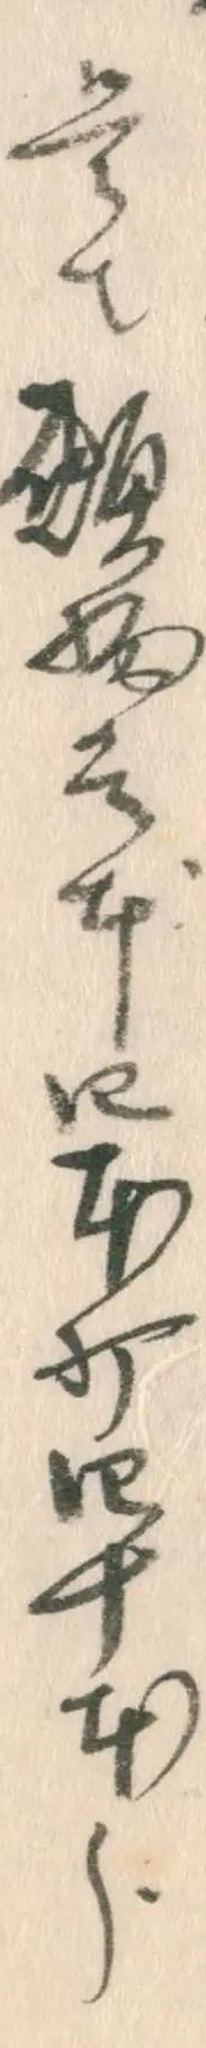是は頬柄受板壱本四本打四拾本分
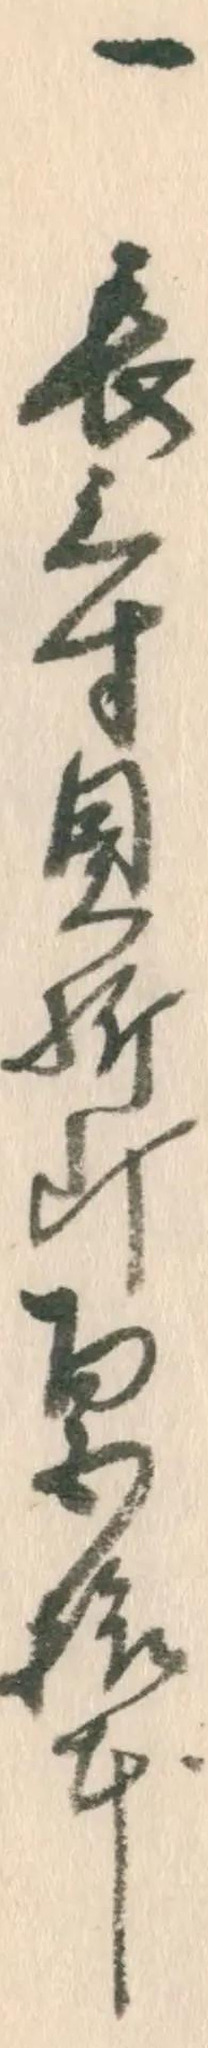一長三寸貝折釘百五拾本
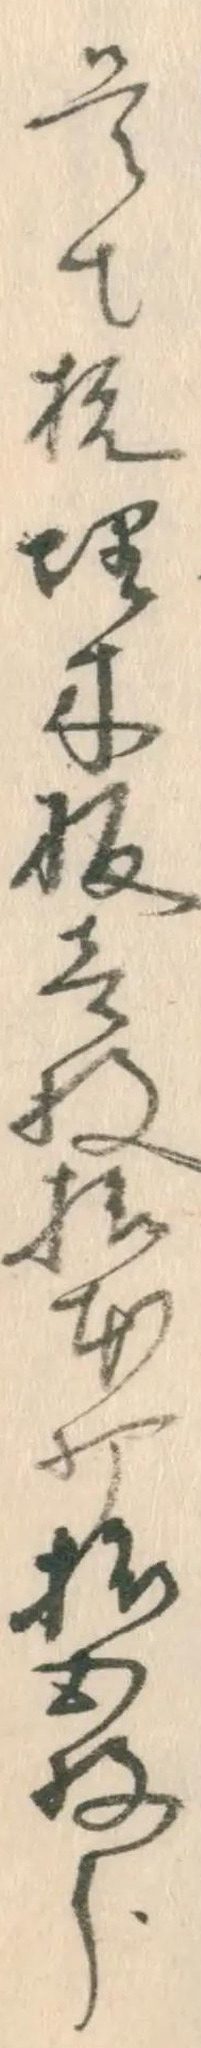是は杭埋木板壱枚拾本打拾五枚分

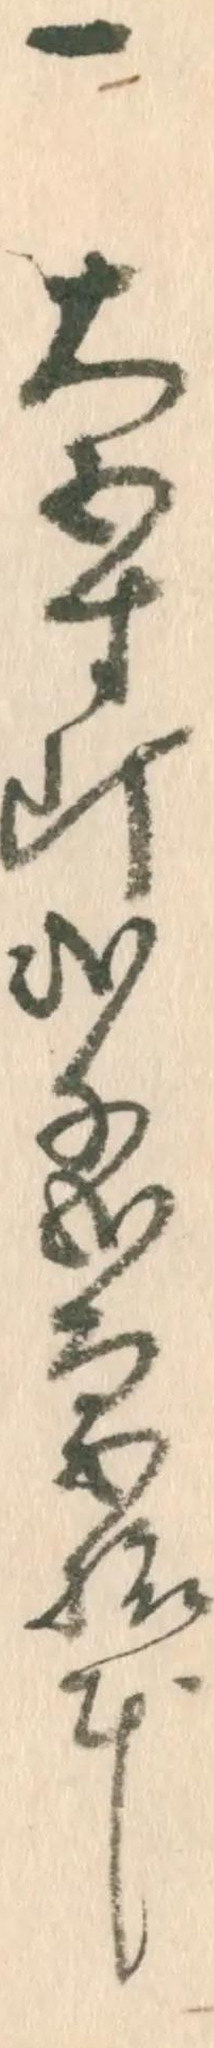一大五寸釘弐千弐百五拾本
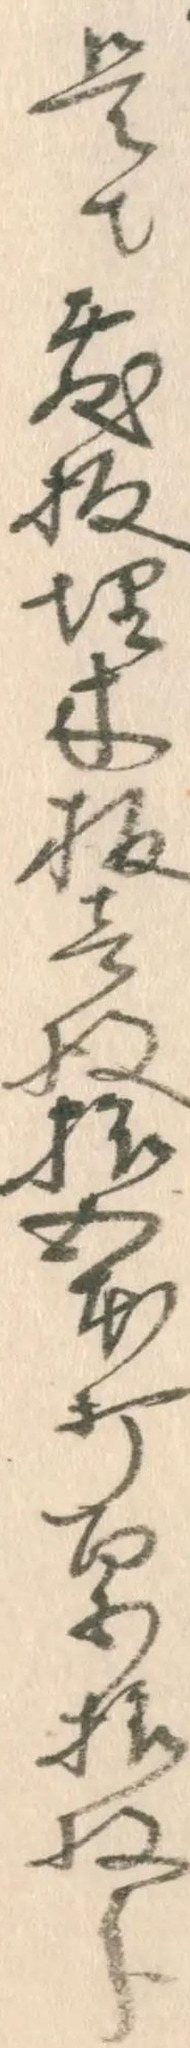是は敷板埋木板壱枚拾五本打百五拾枚分
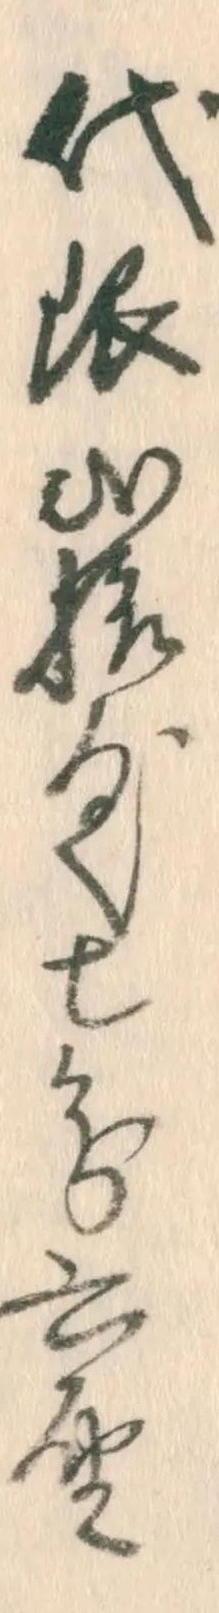代銀弐拾匁七分六厘
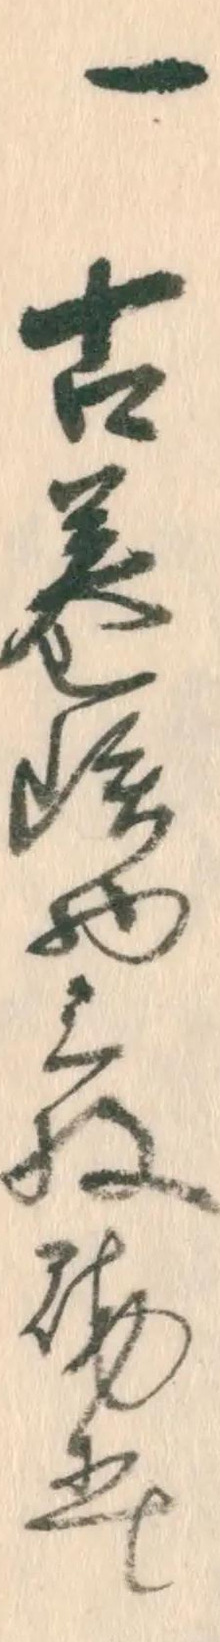一古巻鉄物三枚焼直し
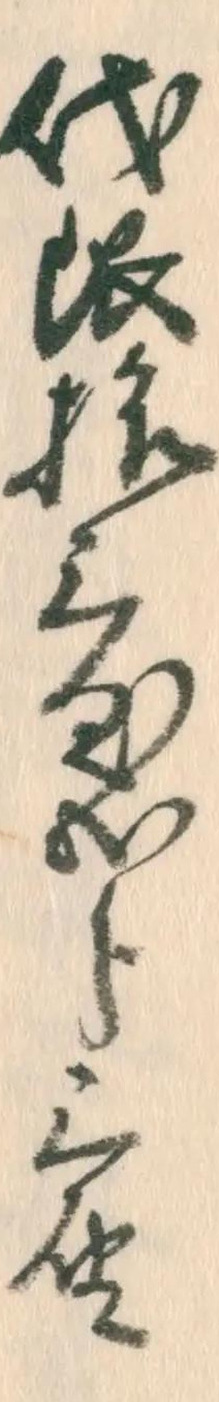代銀拾三匁弐分三厘
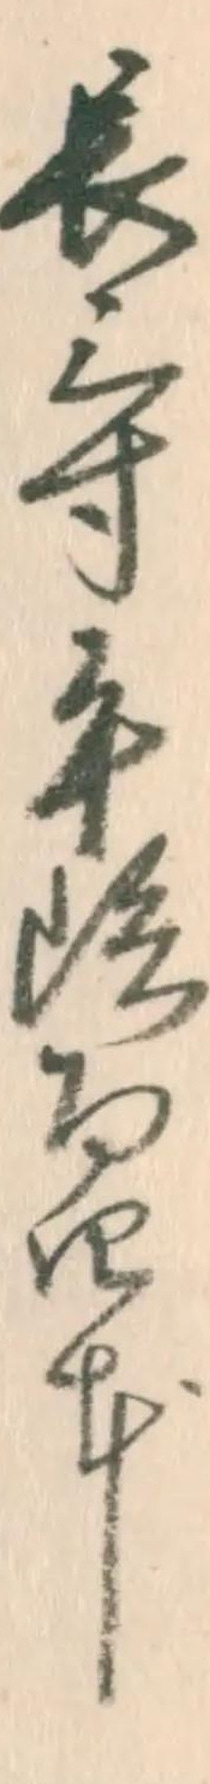一長三寸平鋲百四本
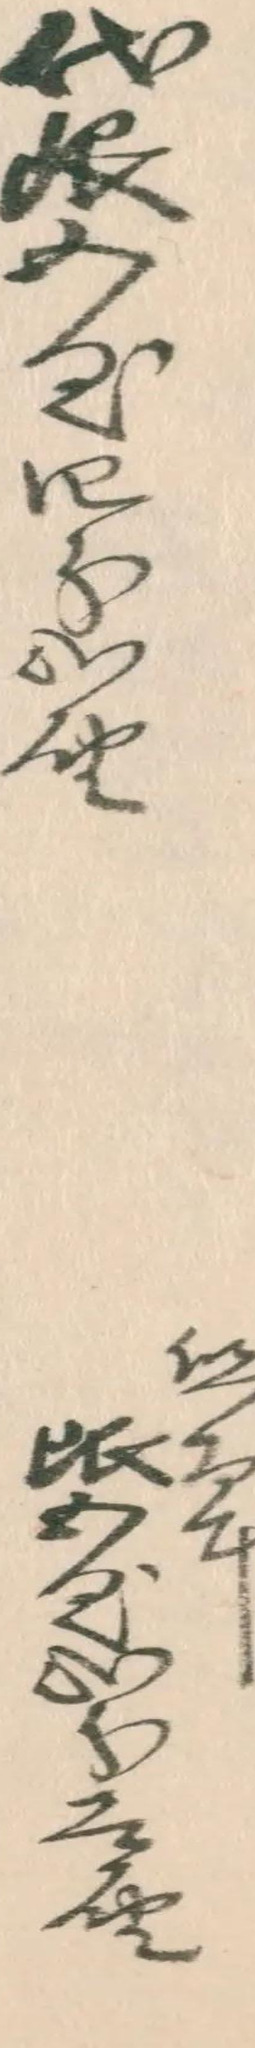代銀五匁四分弐厘但百本銀五匁弐分壱厘
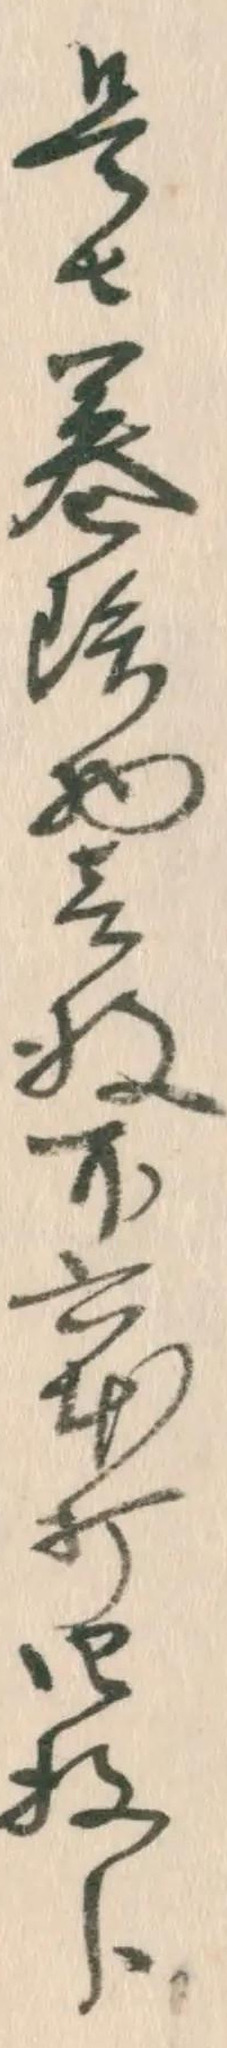是は巻鉄物壱枚廿六本打四枚分
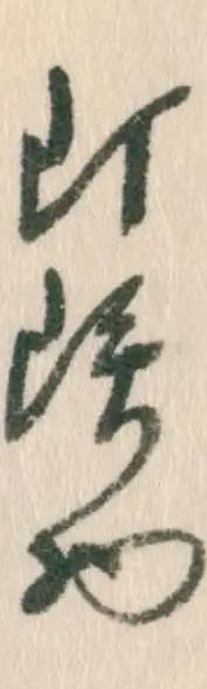釘鉄物
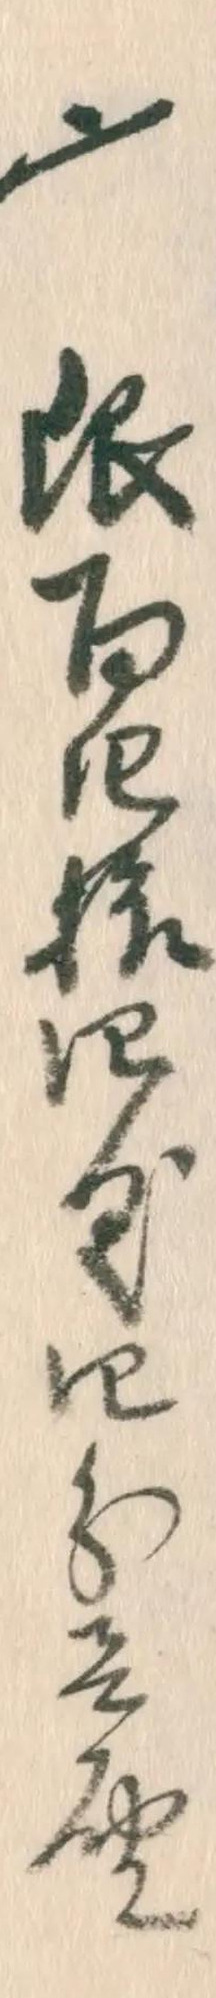〆銀百四拾四匁四分壱厘
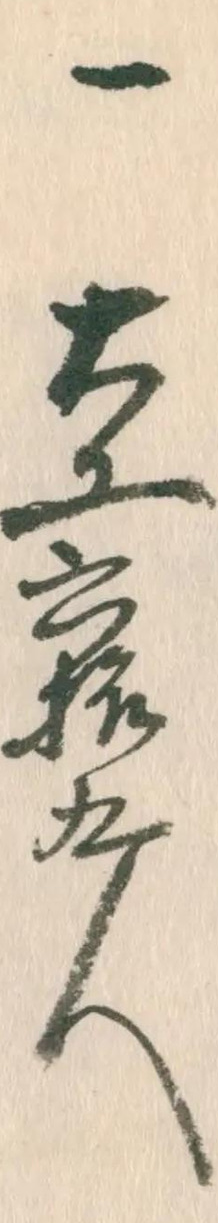一大工六拾九人
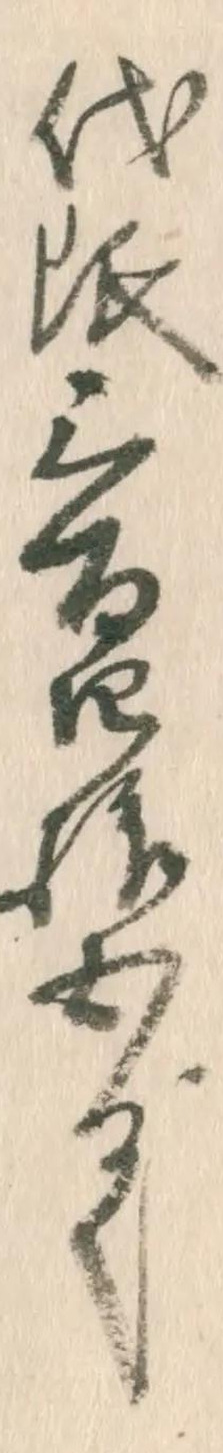代銀三百四拾五匁但壱人銀五匁
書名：三橋 17巻. [7] 三橋小破御修復書留　但御奉行御掛リ替地震潰橋番屋　嘉永四亥年より安政二卯年迄　上
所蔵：国立国会図書館 National Diet Library, JAPAN
